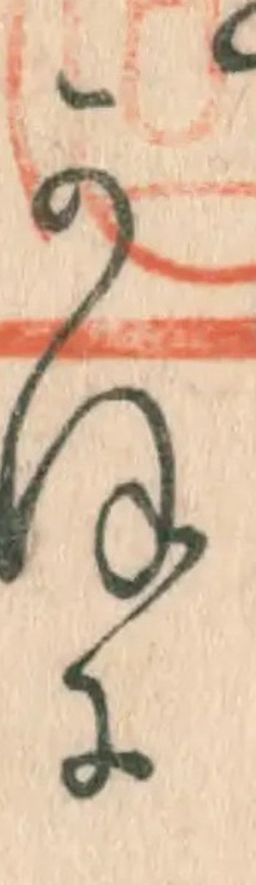かほに
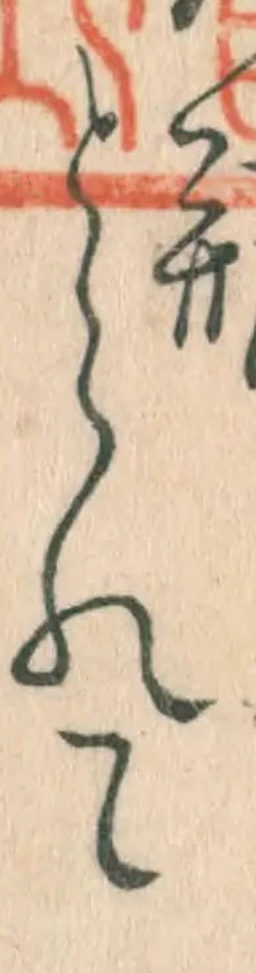とられて

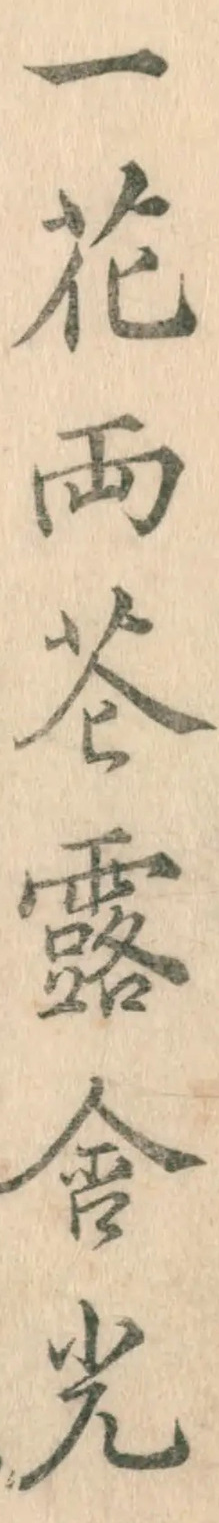一花両花露含光
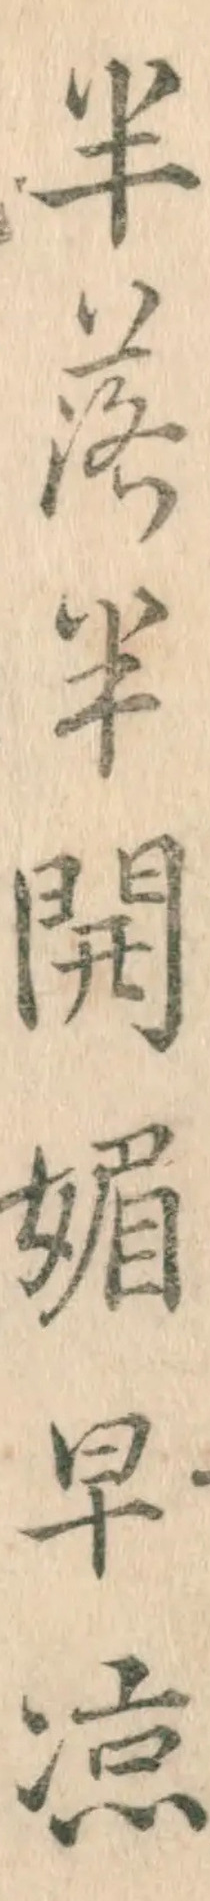半落半開媚早涼
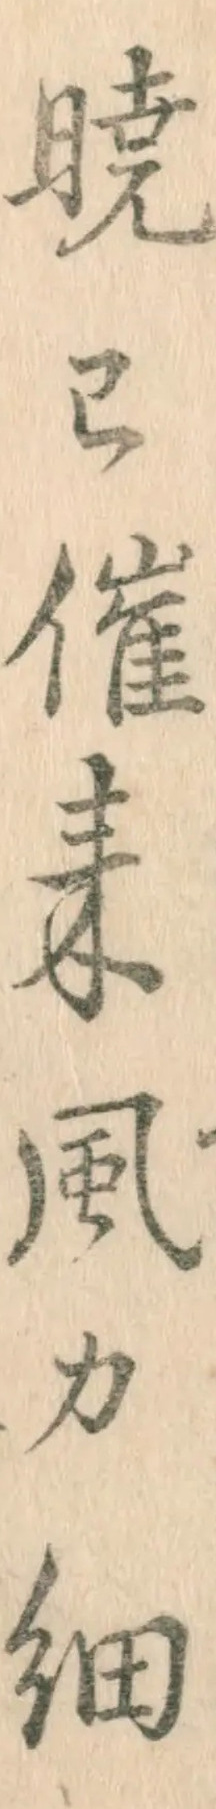暁已催来風カ細
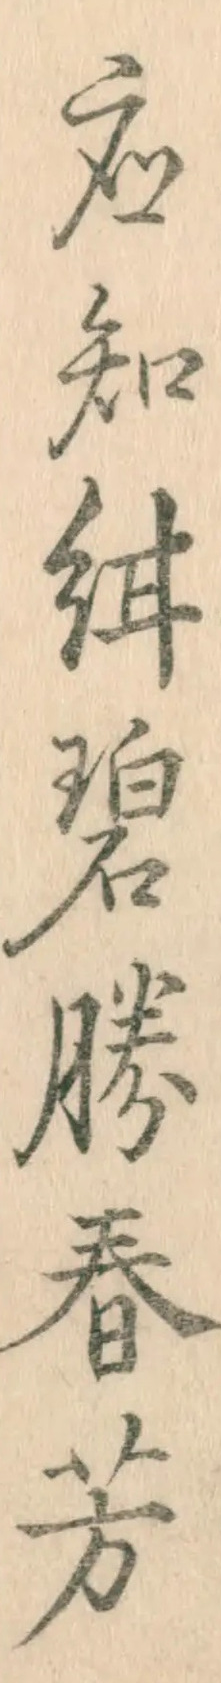名知紺碧勝春芳
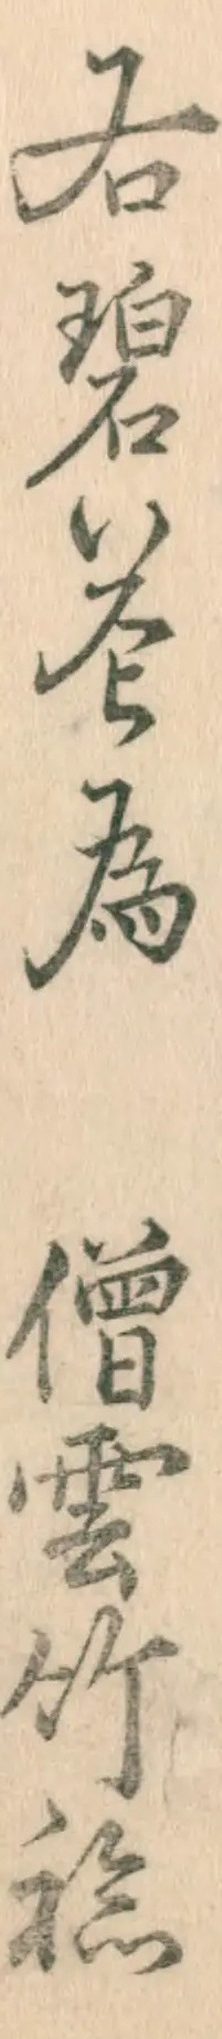右碧答為僧雲竹稔
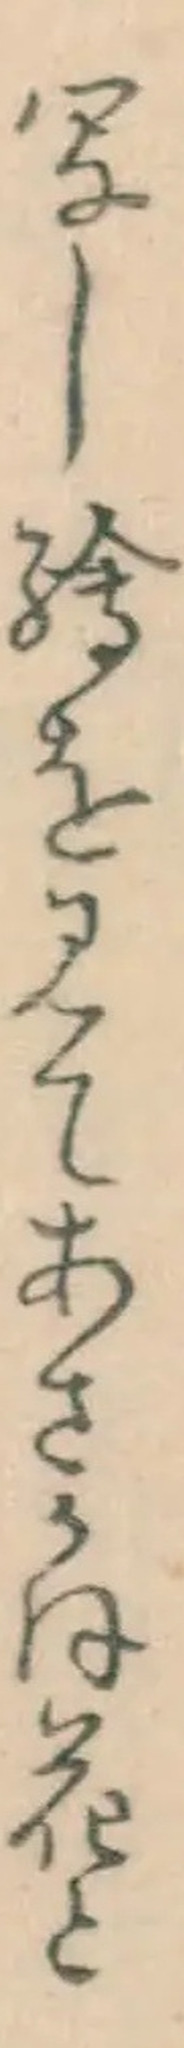写し絵を見てあさかほ花と
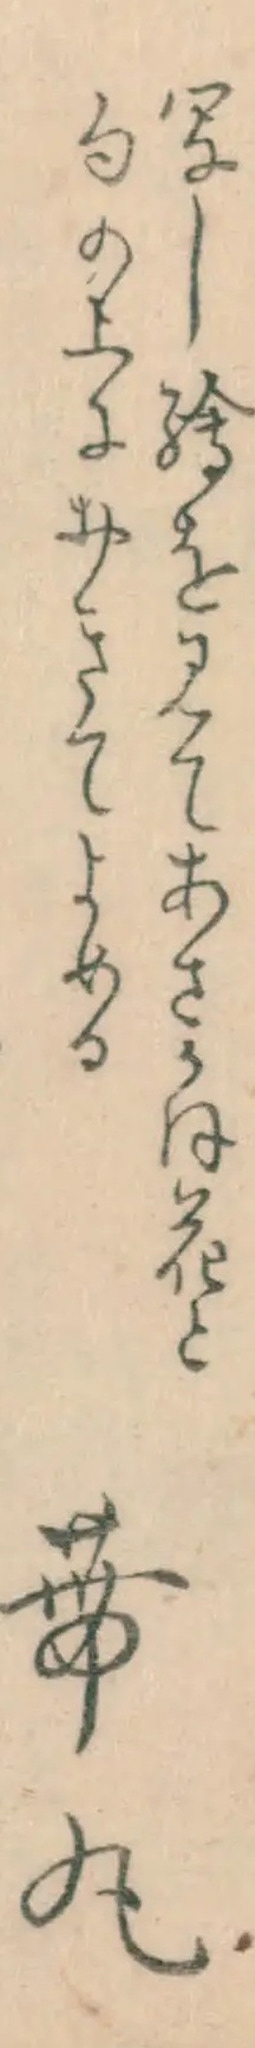句の上におきてよめる華丸
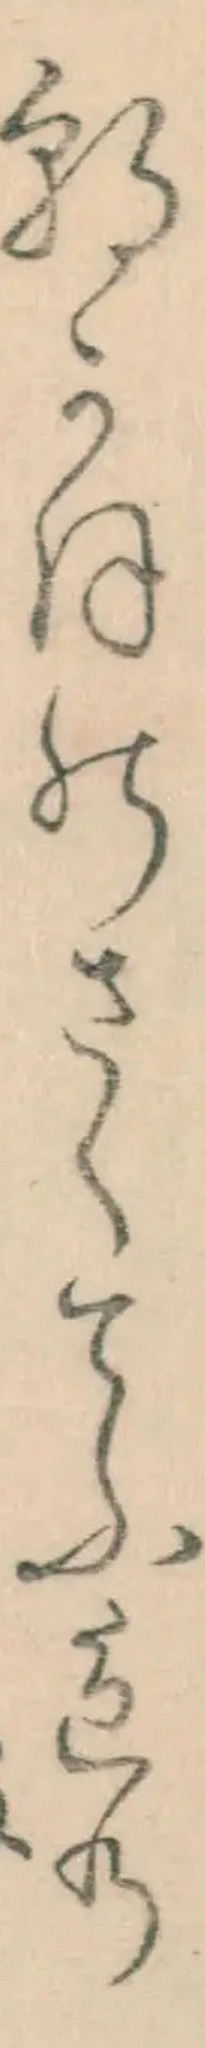朝かほのさくてふ道の
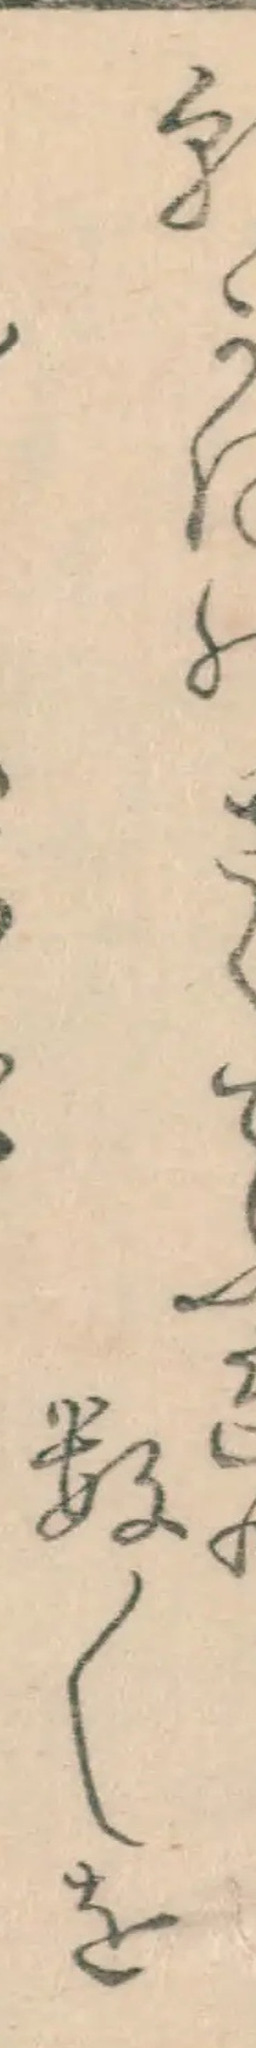数〳〵を
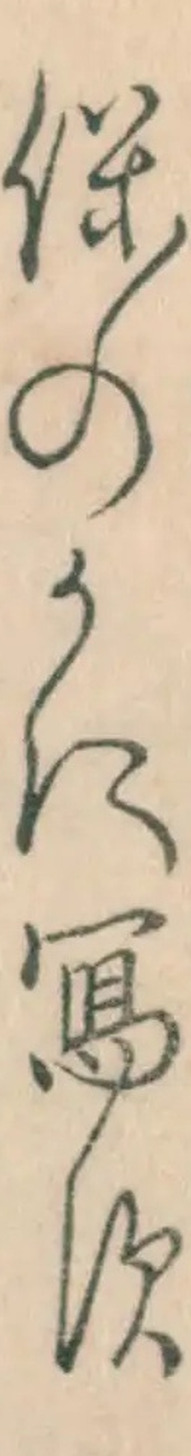ほのかに寫す
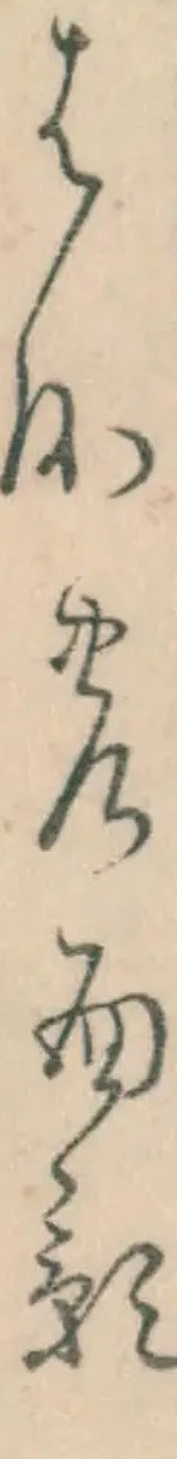はなの面影
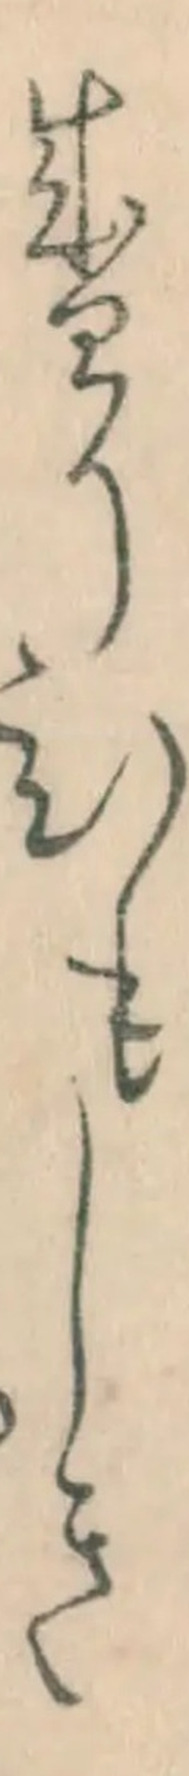香りひもしき
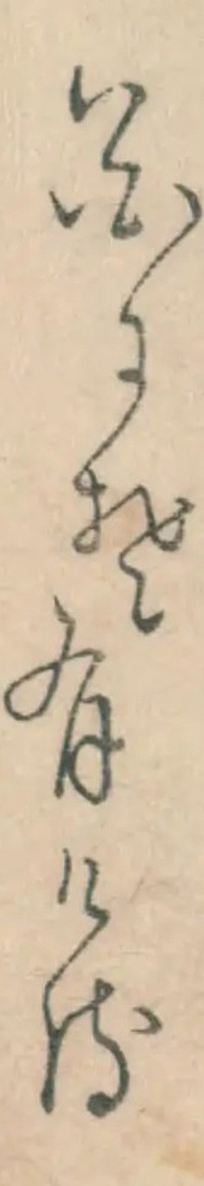花にそ有ける

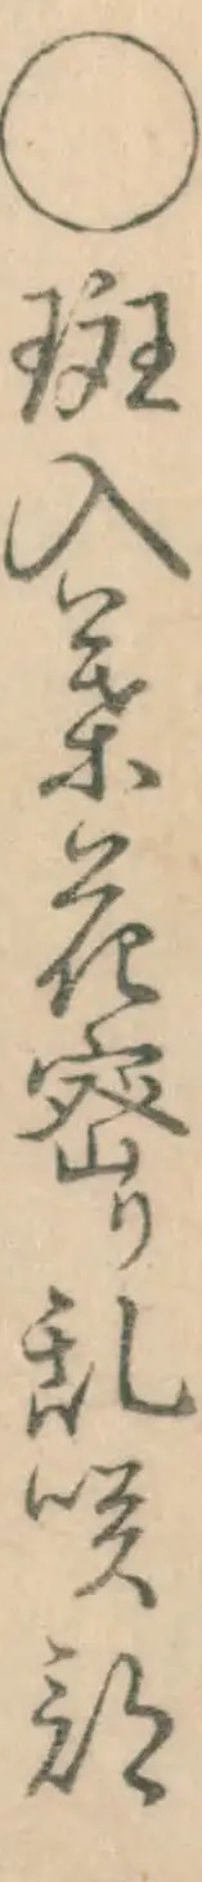○斑入葉花蜜り乱咲顔
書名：花壇朝顔通 2巻. [2]
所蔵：国立国会図書館 National Diet Library, JAPAN
